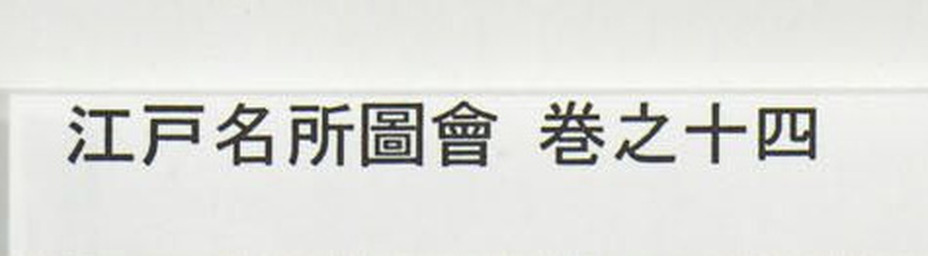江戸名所図会巻之五
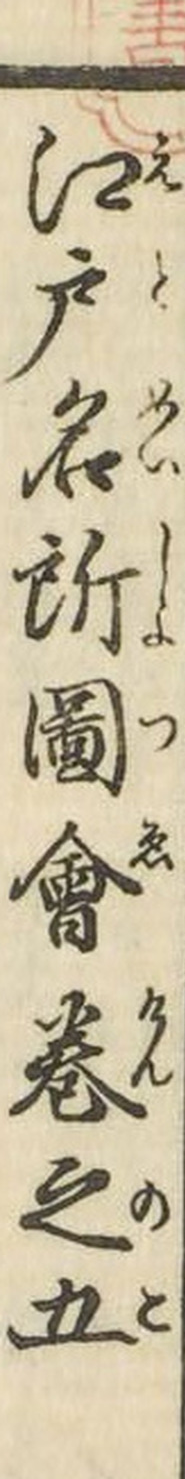江戸名所図会巻之五
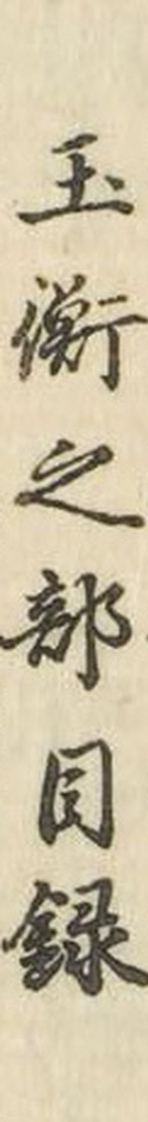玉衡之部目録

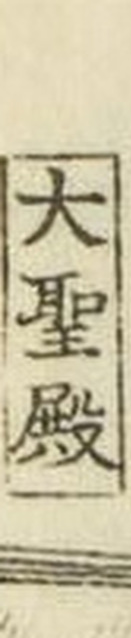大聖殿
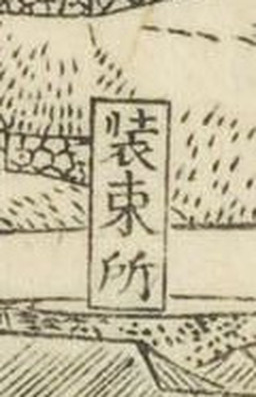装束所
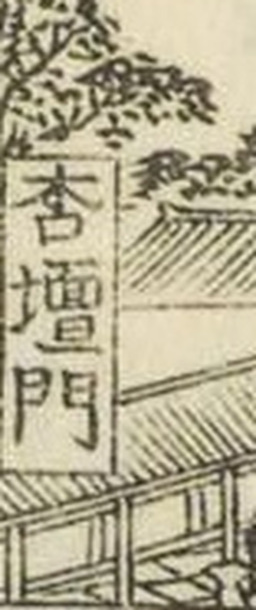杏壇門
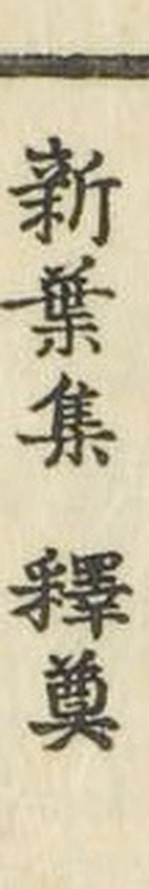新葉集釈奠
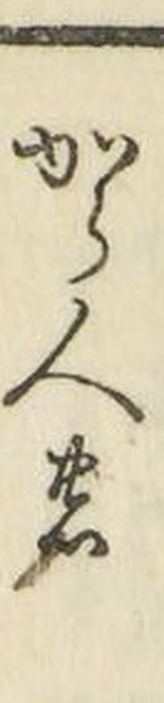から人の
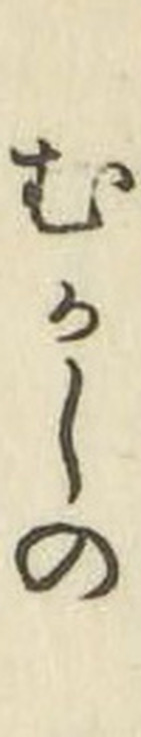むかしの
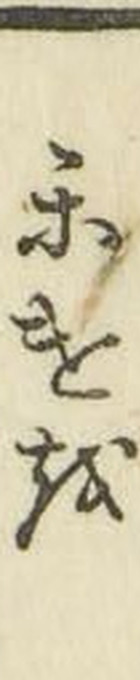かけを
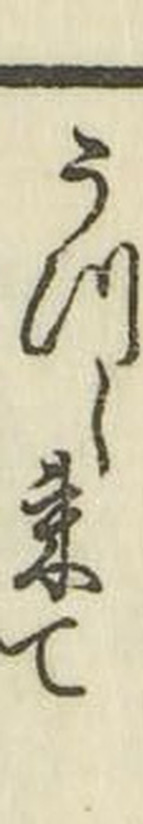うつし来て
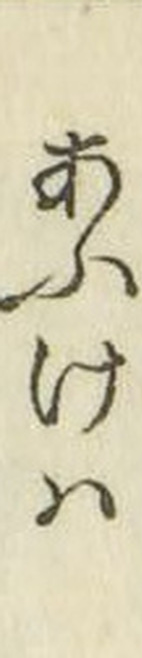あふけは
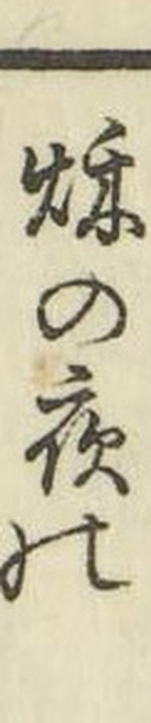秋の夜の
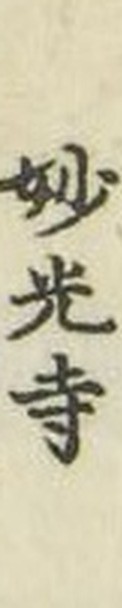妙光寺
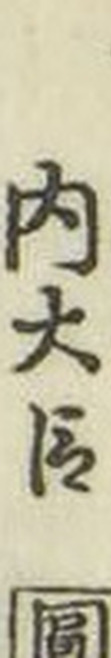内大臣
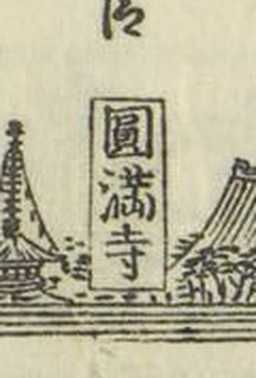円満寺
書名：江戸名所図会 20巻 巻之14
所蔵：東京学芸大学教育コンテンツアーカイブ
